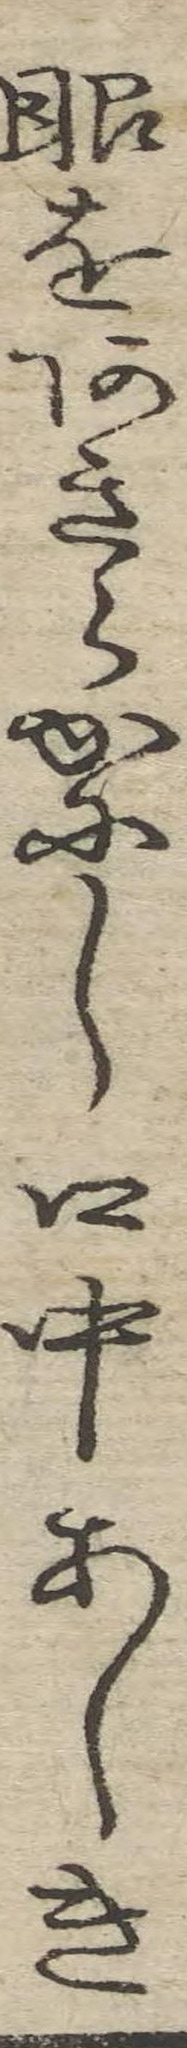眼をあきらかにし口中あしき
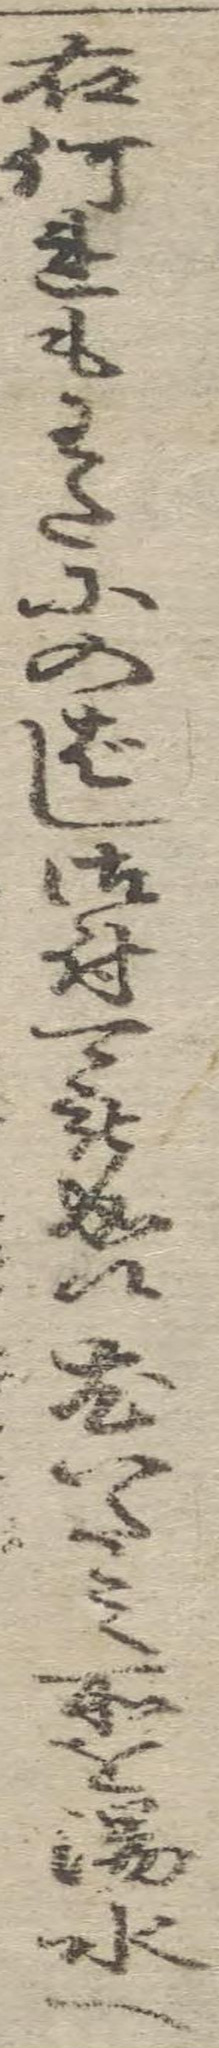右何れもわたにのばし御付可被成候尤いたみ所を湯水へ
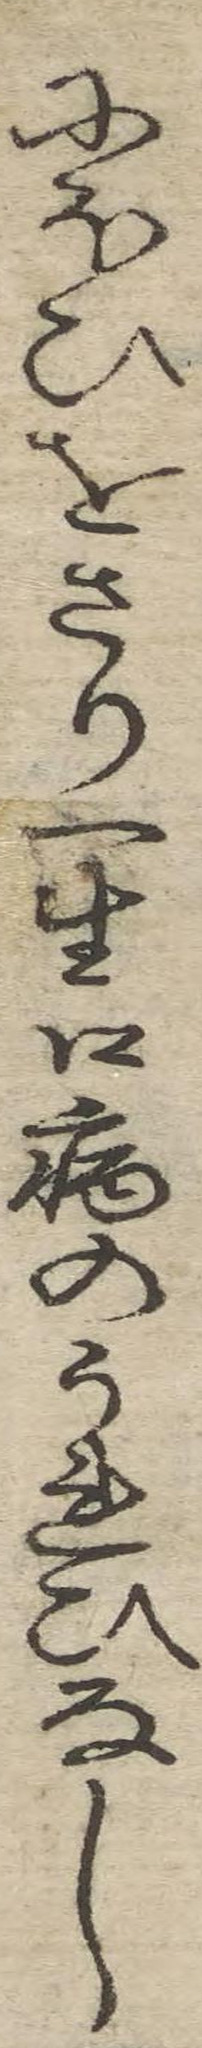にほひをさり一生口病のうれひなし
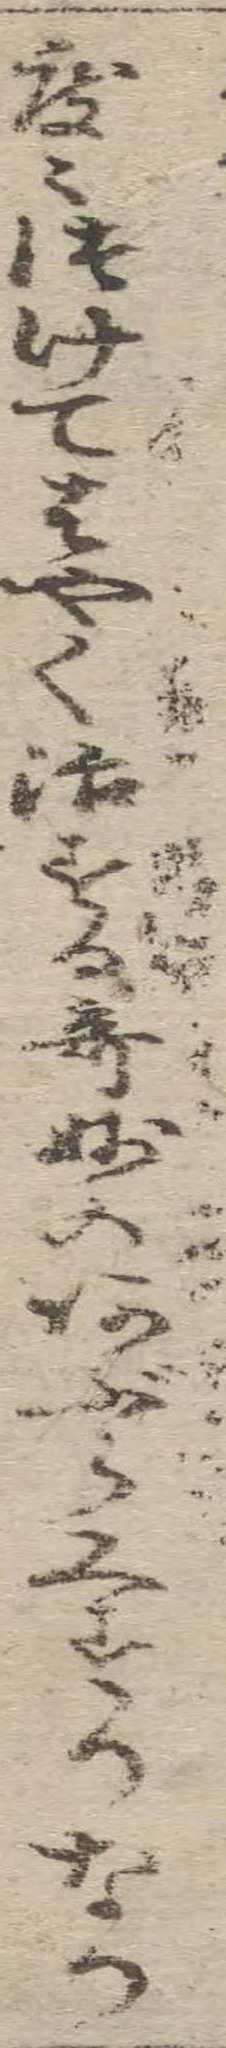度々つけてはやく治する奇妙のあぶらくすりなり
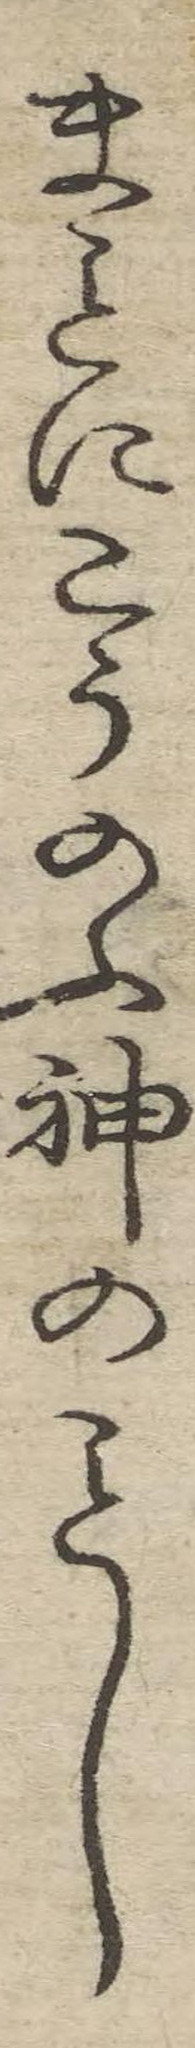まことにこうのふ神のことし
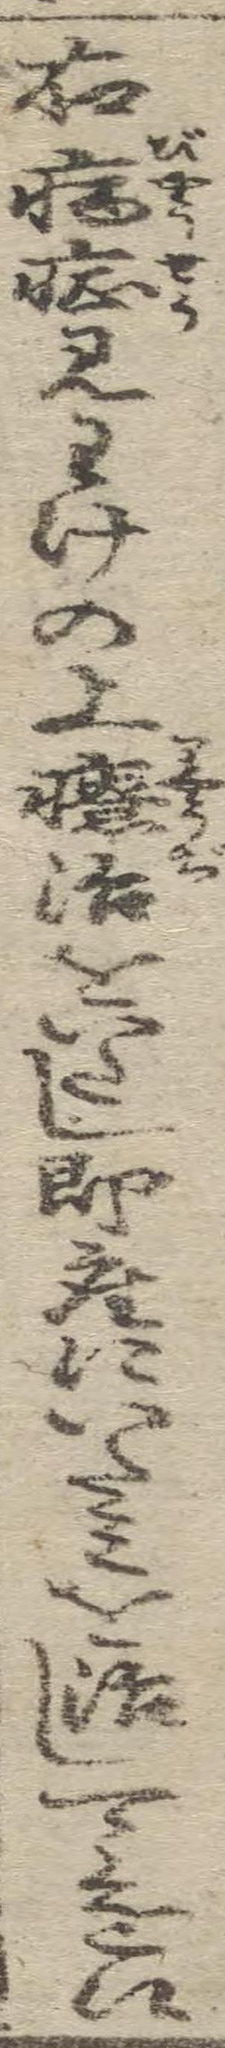右病症見わけの上療治をいたし即座にいたみを治し可進候
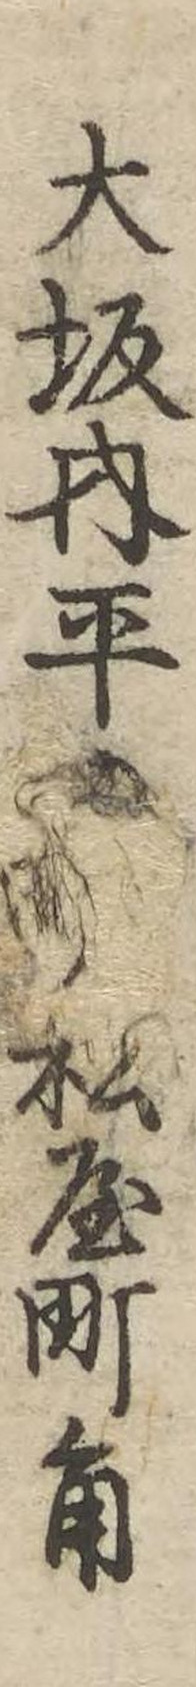大坂内平松屋町角
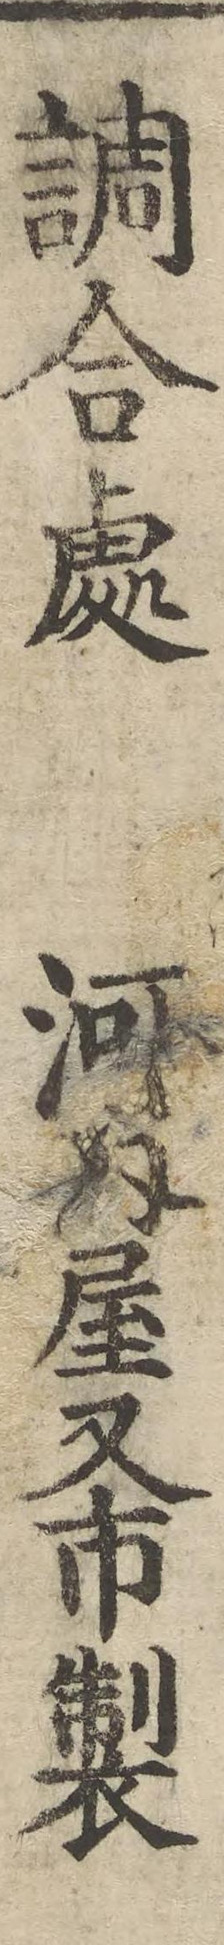調合處河内屋又市製
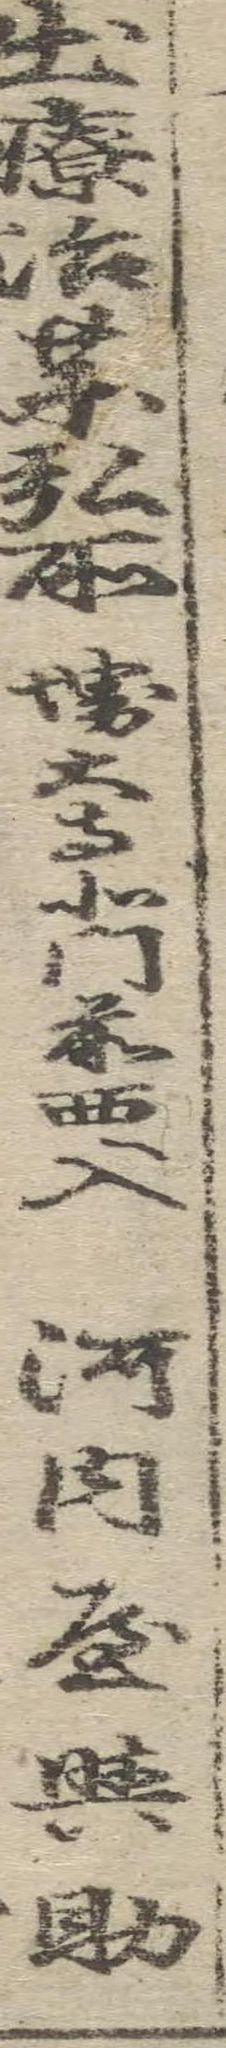出療治薬弘所堺大寺北門前西へ入河内屋与助
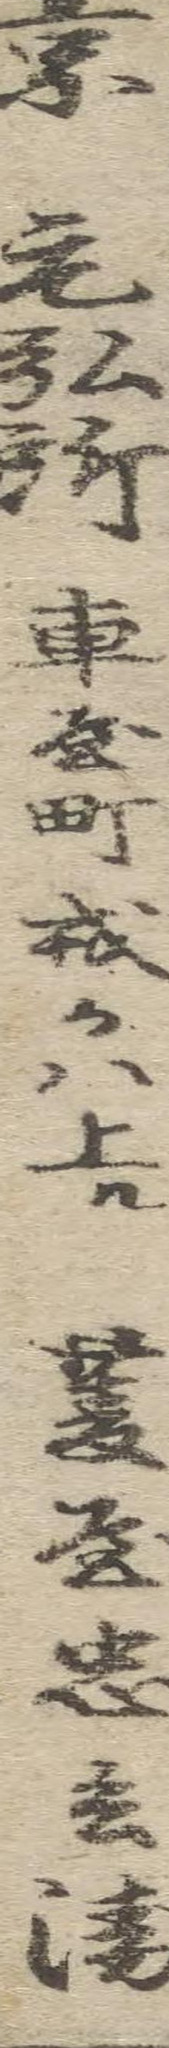京元弘所車屋町戎かは上る菱屋忠兵衛
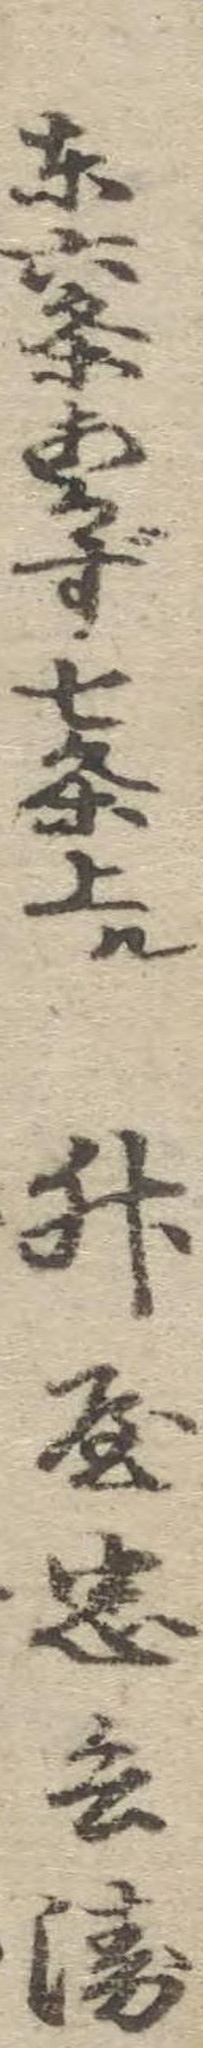京同東六条あかず七條上る升屋忠兵衛
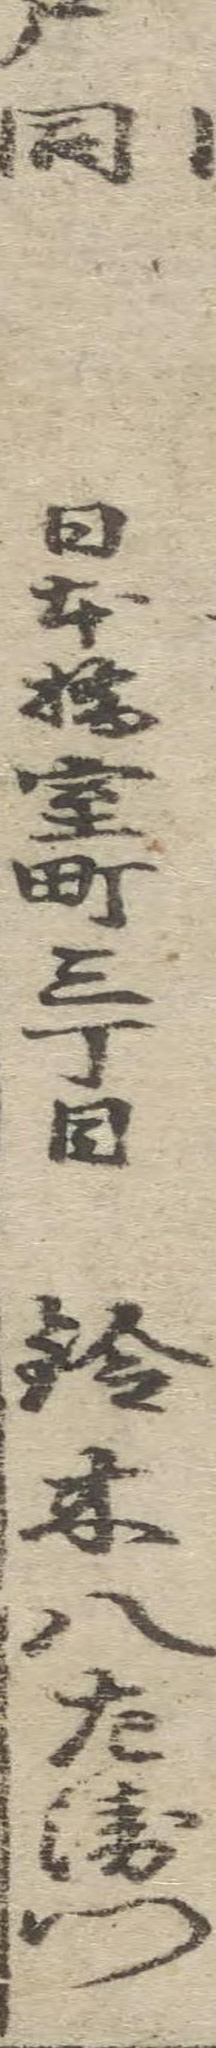江戸同日本橋室町三丁目鈴木八左衛門
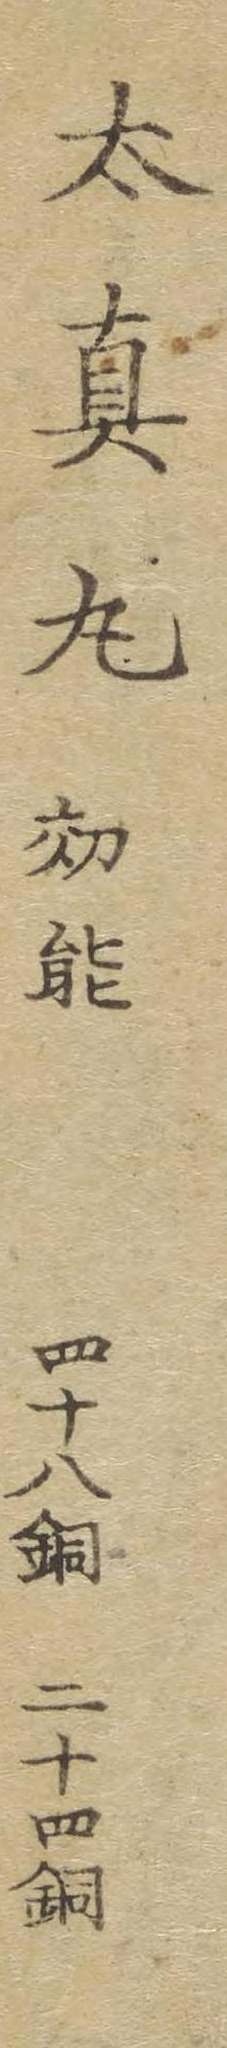太真丸効能四十八銅二十四銅
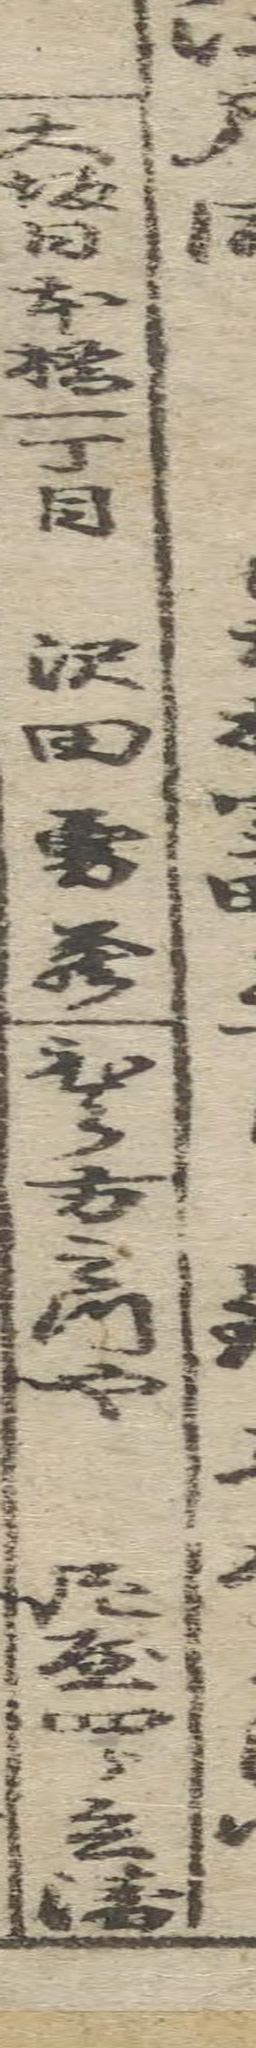大坂日本橋一丁目沢田勇蔵
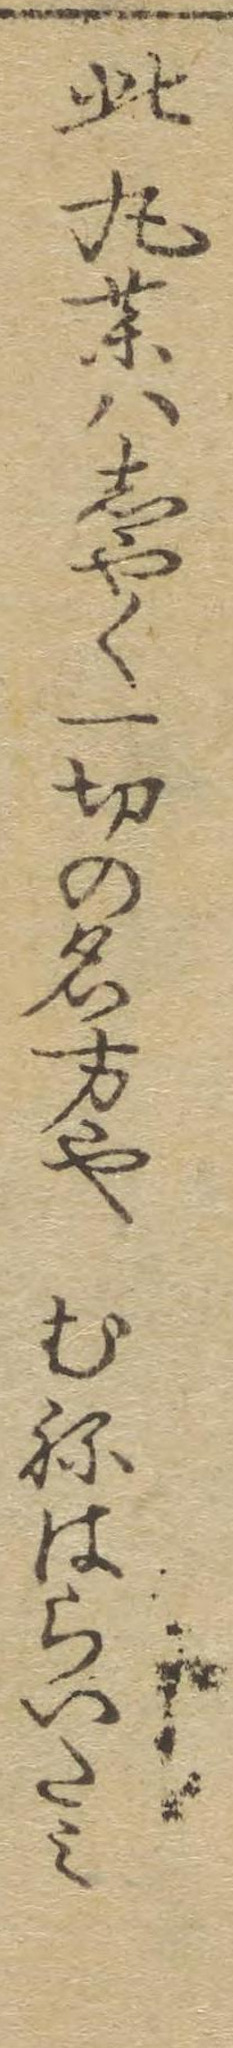此丸薬はしやく一切の名方也むねはらいたみ或は
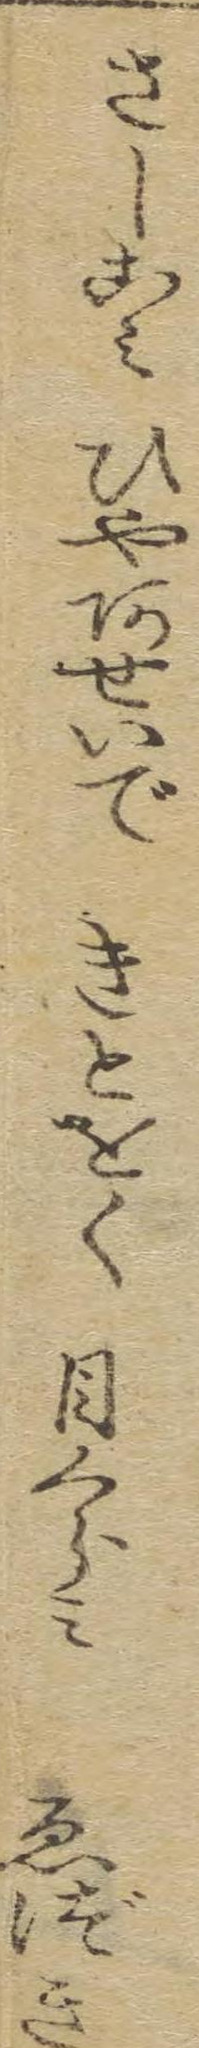さしこみひやあせいできとをく目くらみゑづき
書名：浪華薬種問屋能書張交帖. 二
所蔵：国立国会図書館 National Diet Library, JAPAN
